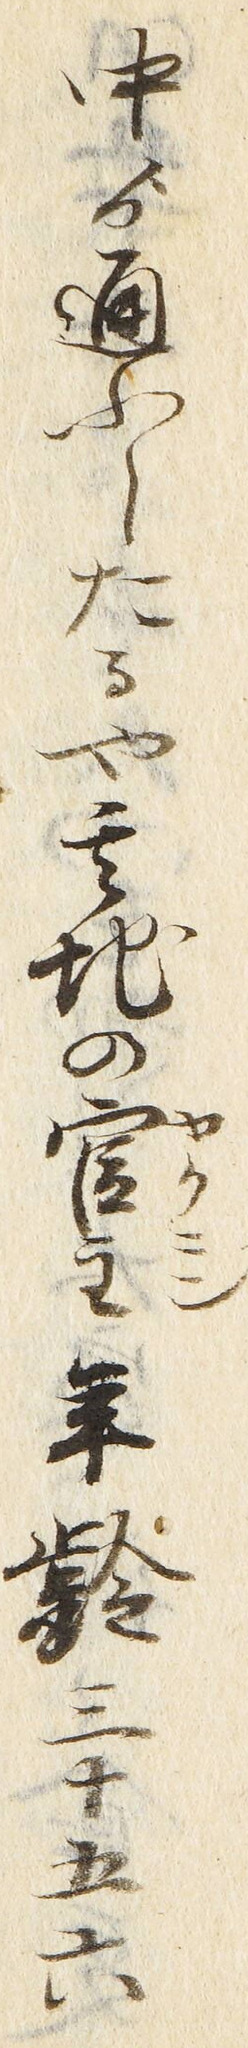中ゟ通ふしたるや其地の官主年齢三十五六
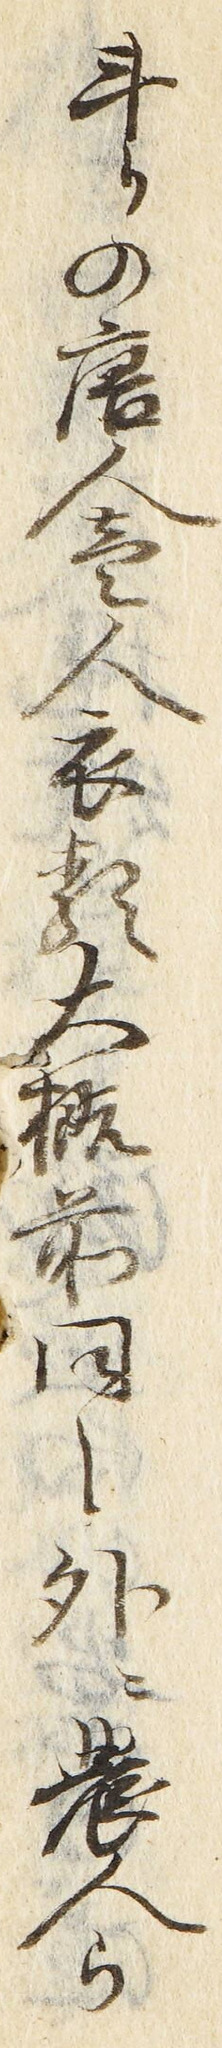計りの唐人壱人衣類大概前同し外に農人ら

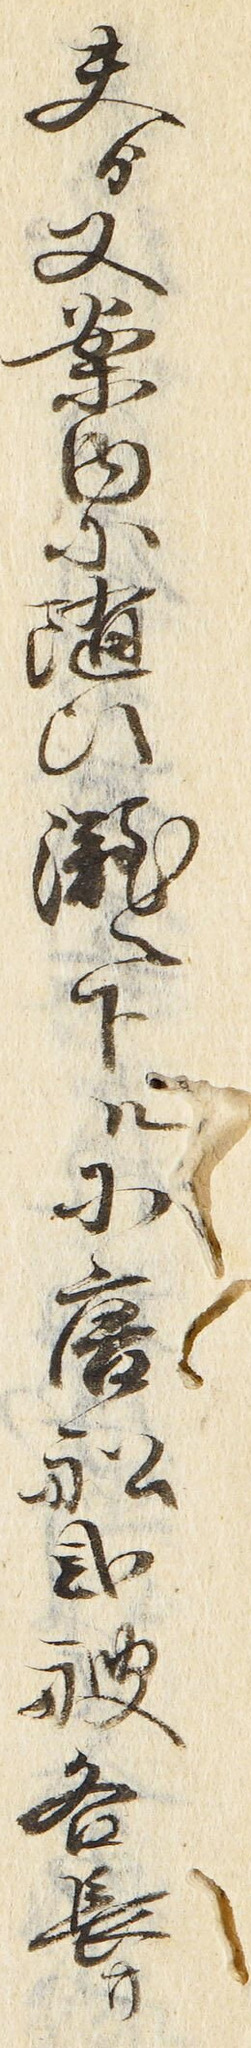夫ゟ又案内に随ひ灘へ下るに唐船弐艘各長さ
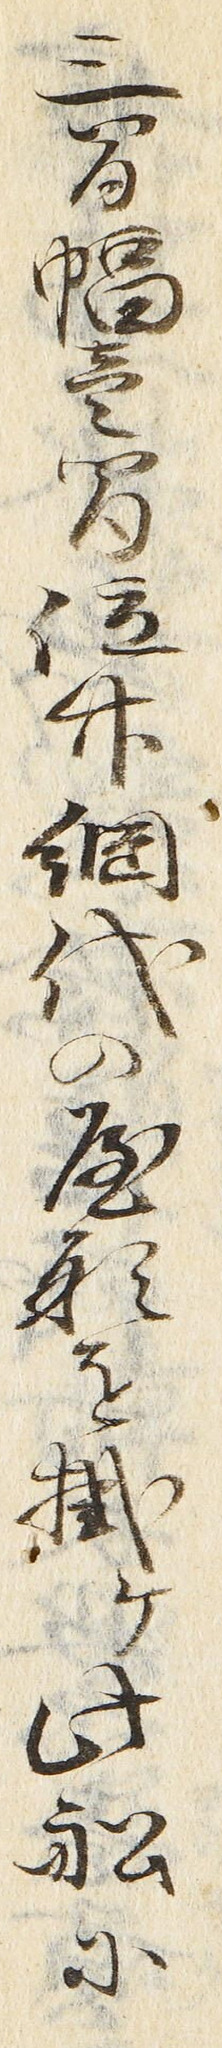三間幅壱間位竹網代の屋形を掛け此船に
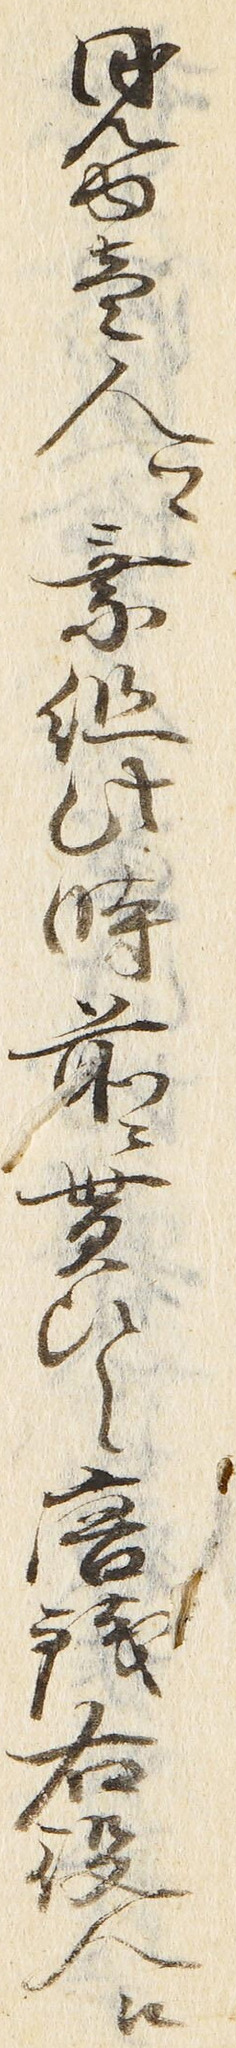見ゆ壱人ツヽ乗但此時前に貰ひし唐銭右役人え
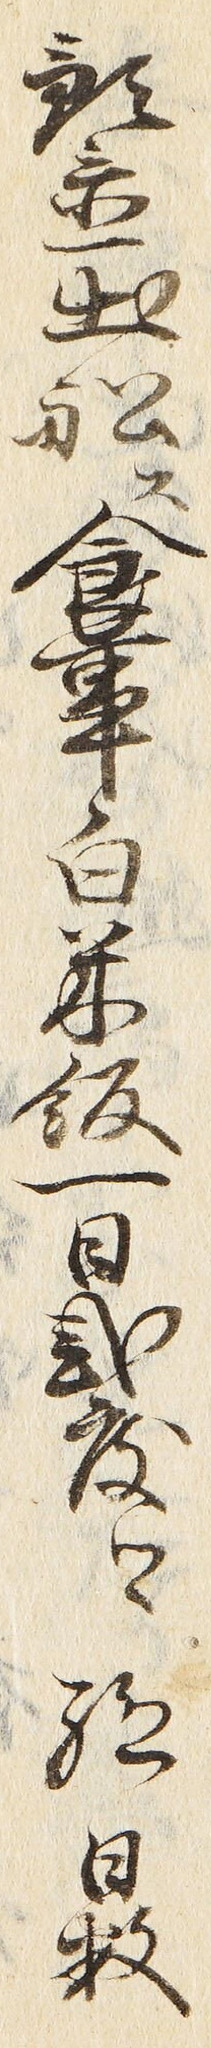預置出船す食事白米飯一日弐度ツヽ給日数
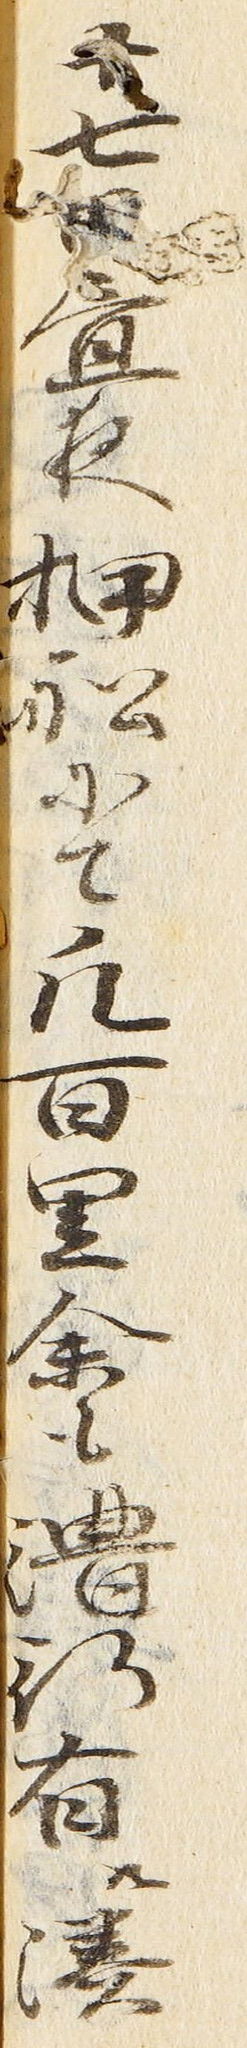共七日昼夜押船にて凡百里余も漕行有る湊
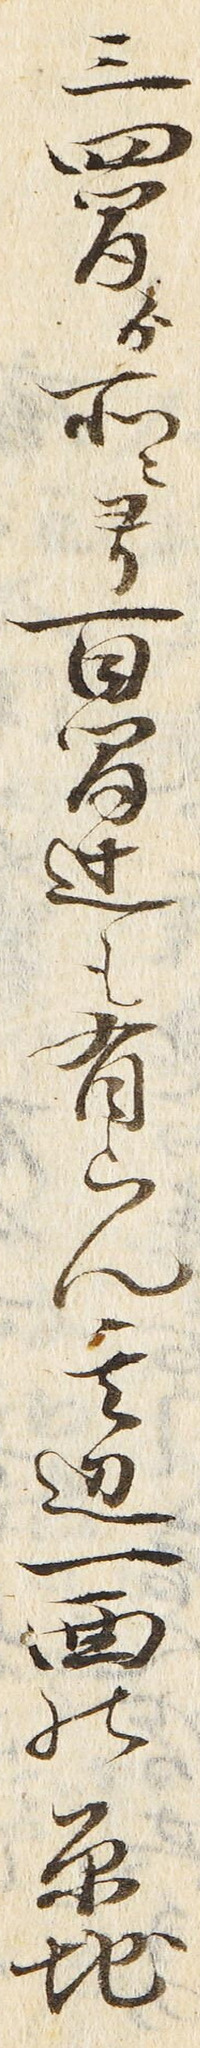三四間ゟ所により百間辻も有らん其辺一面の原地
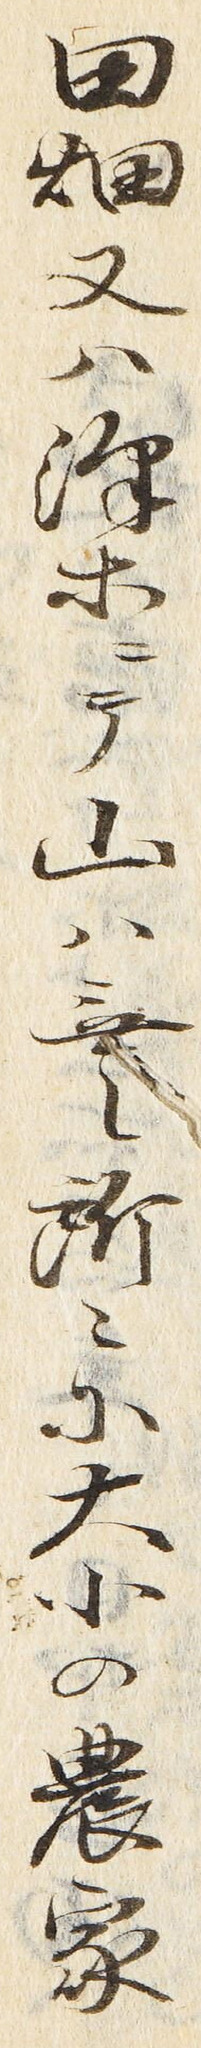田畑又は沢等にて山は無し所に大小の農家
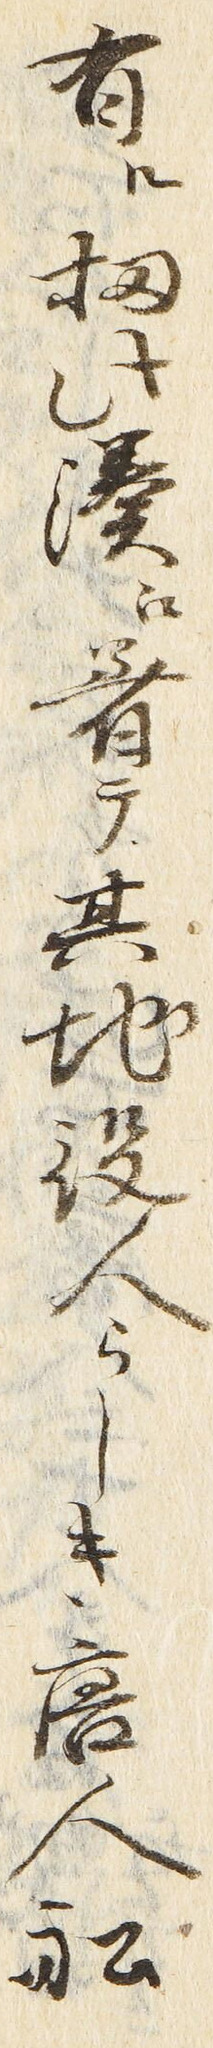有る扨此湊え尽きて着て其地役人らしき唐人船
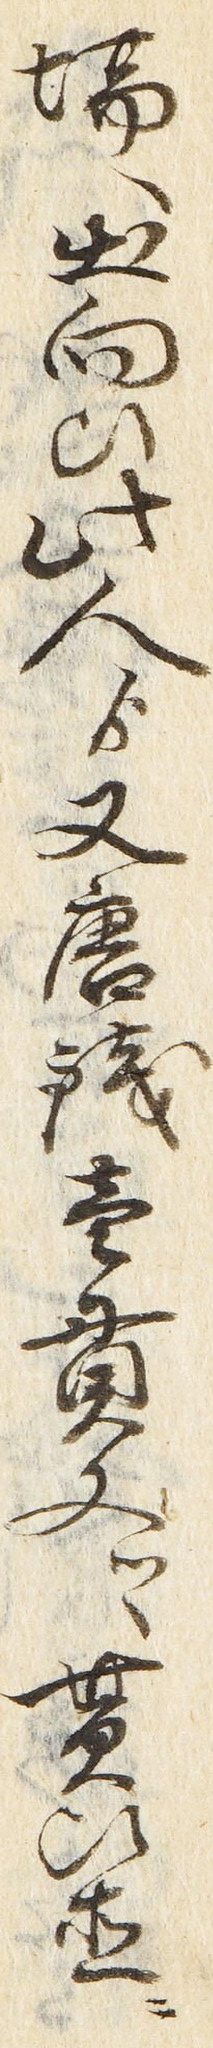場へ出向ひ此人ゟ又唐銭壱貫文ツヽ貰ひ直に
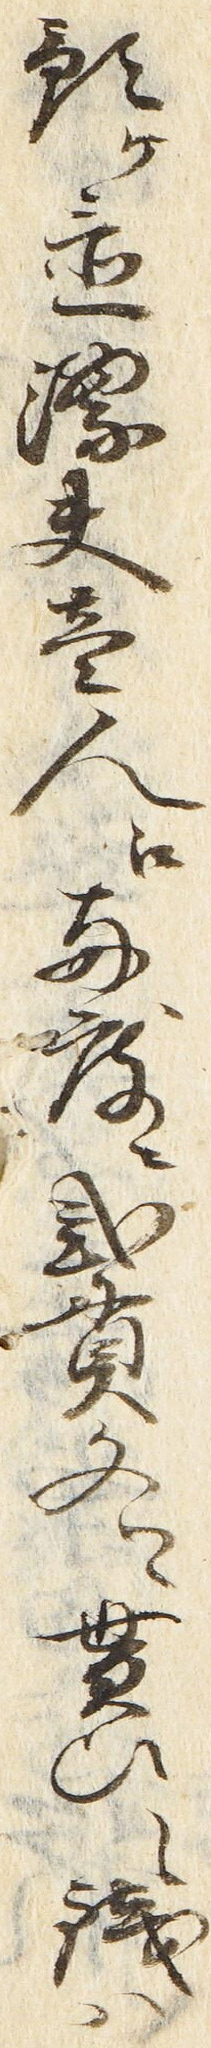預け置漂夫壱人え両度に弐貫文ツヽ貰ひし残は

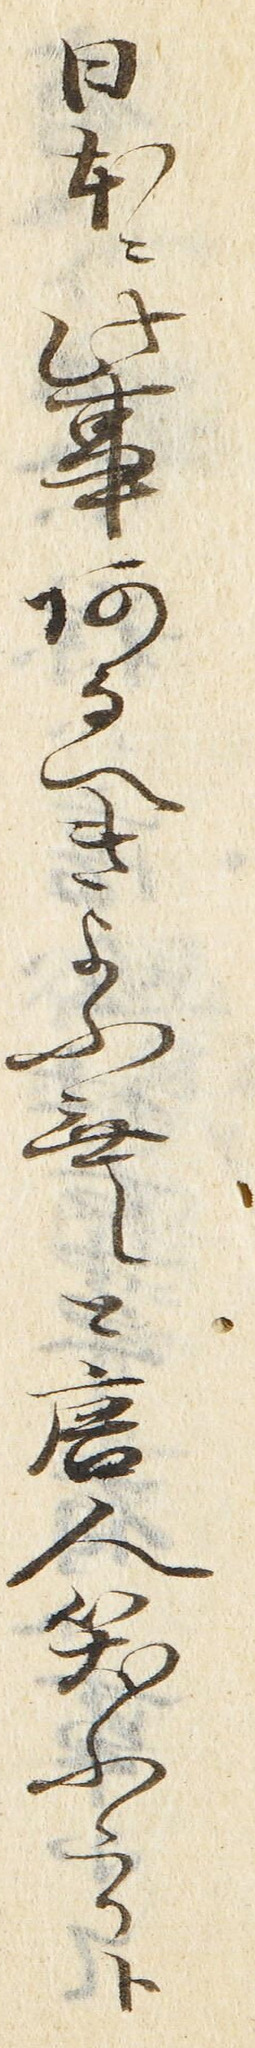日本に此事をあるへきよふ無しと唐人笑ふたりと
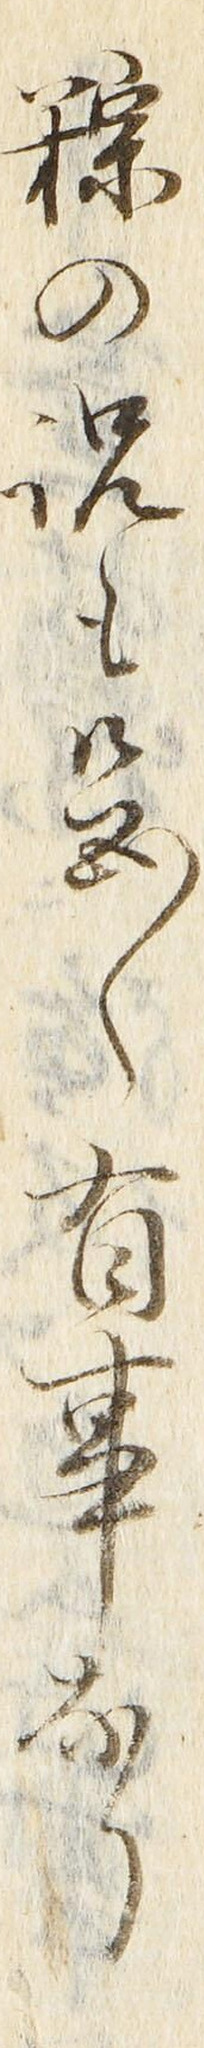粽の説も色〳〵有事なり
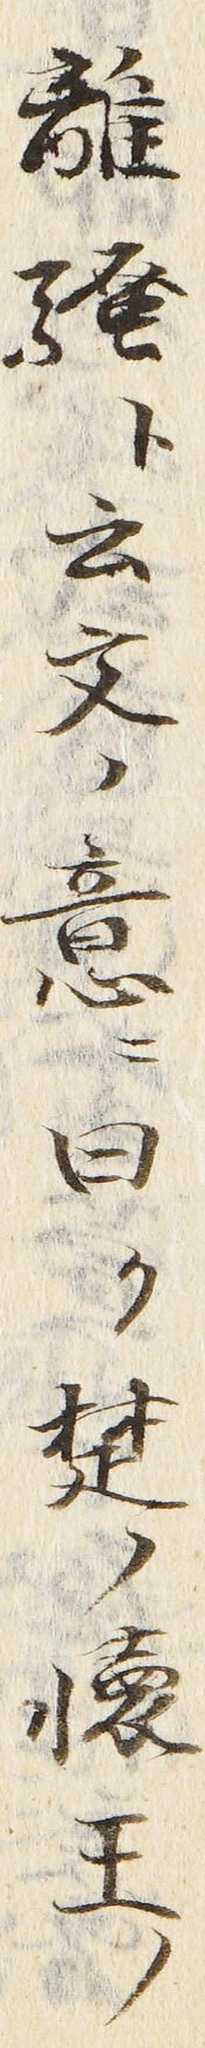離騒と云文の意に曰く楚の懐王の
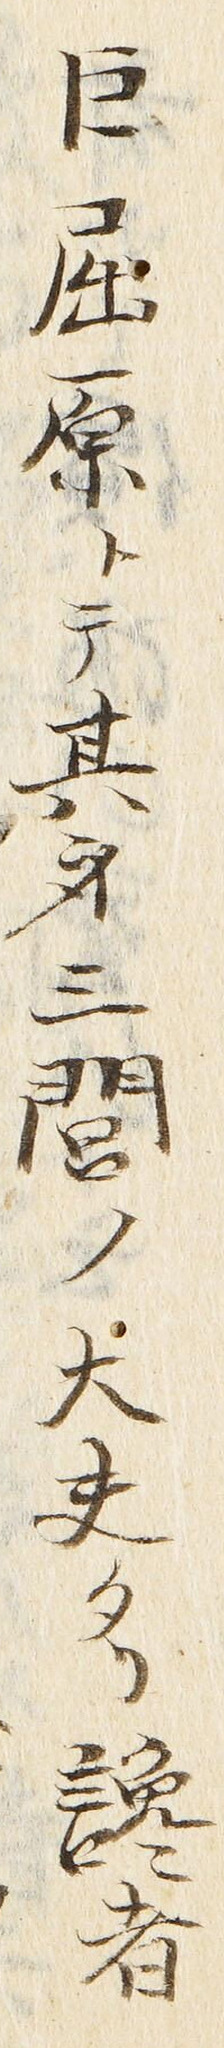巨屈原とて其身三閭の大夫たり讒者
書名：唐物語
